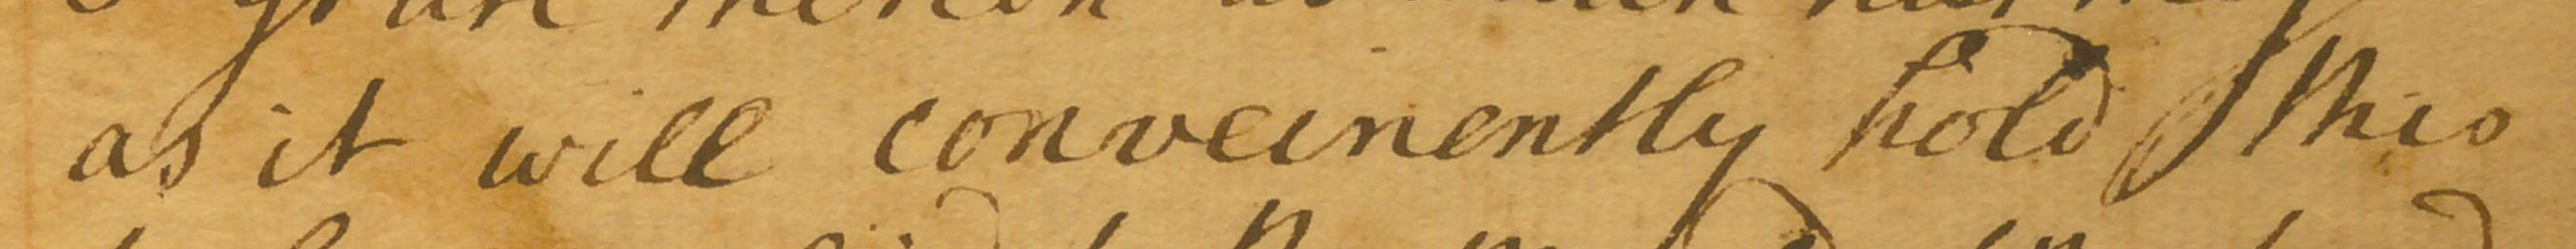as it will conveinently hold this
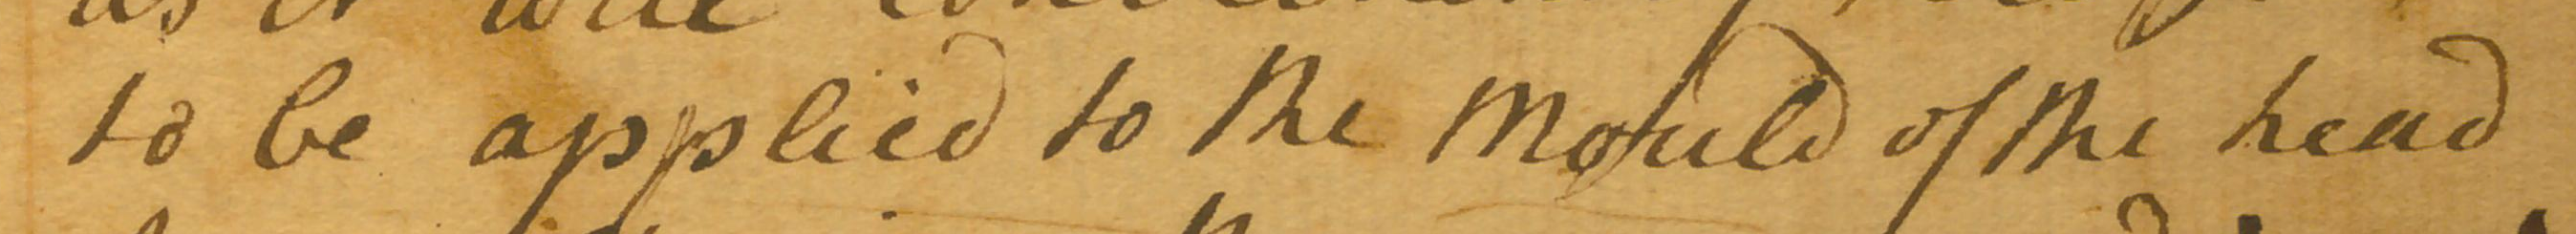to be applied to the mould of the head
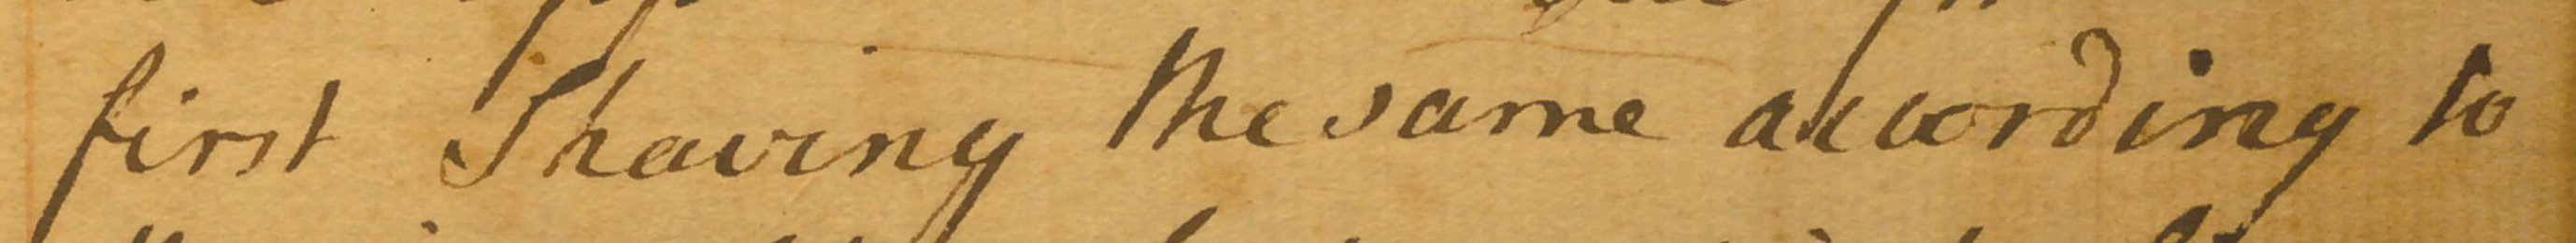first shaving the same according to
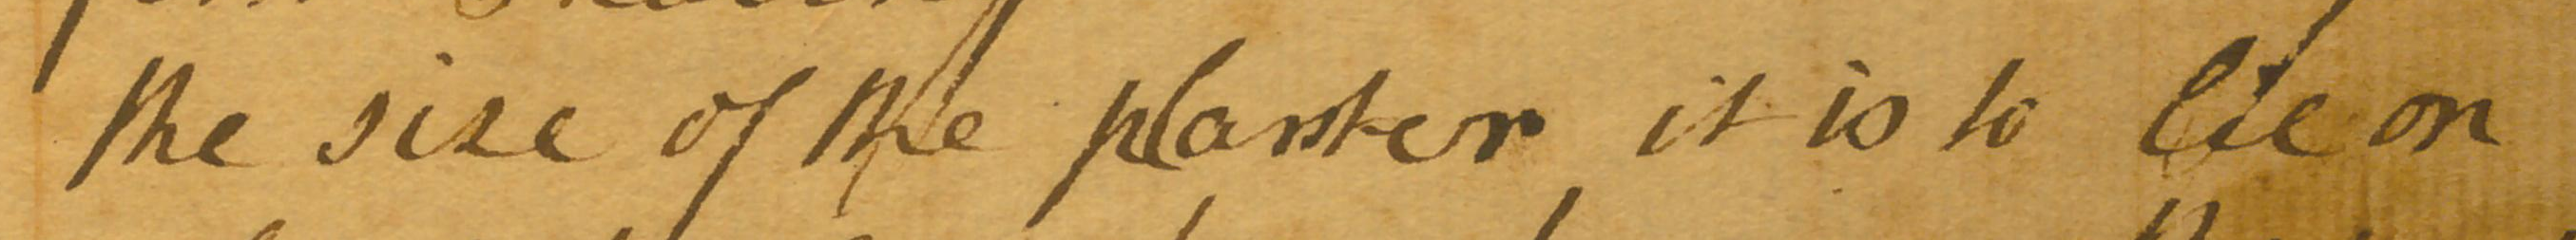the size of the plaster it is to lie on
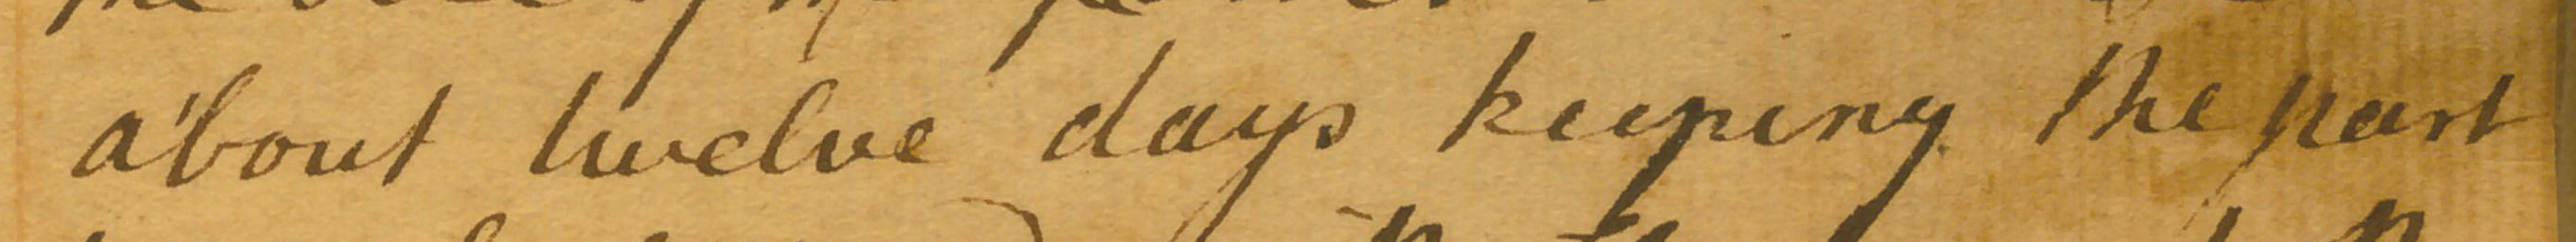about twelve days keeping the part
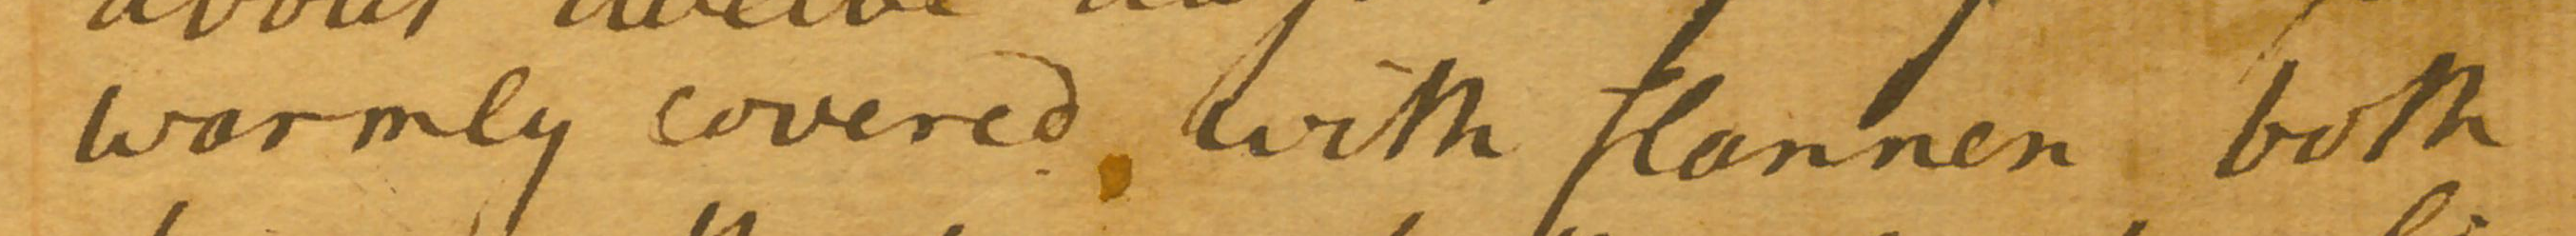warmly covered with flannen both
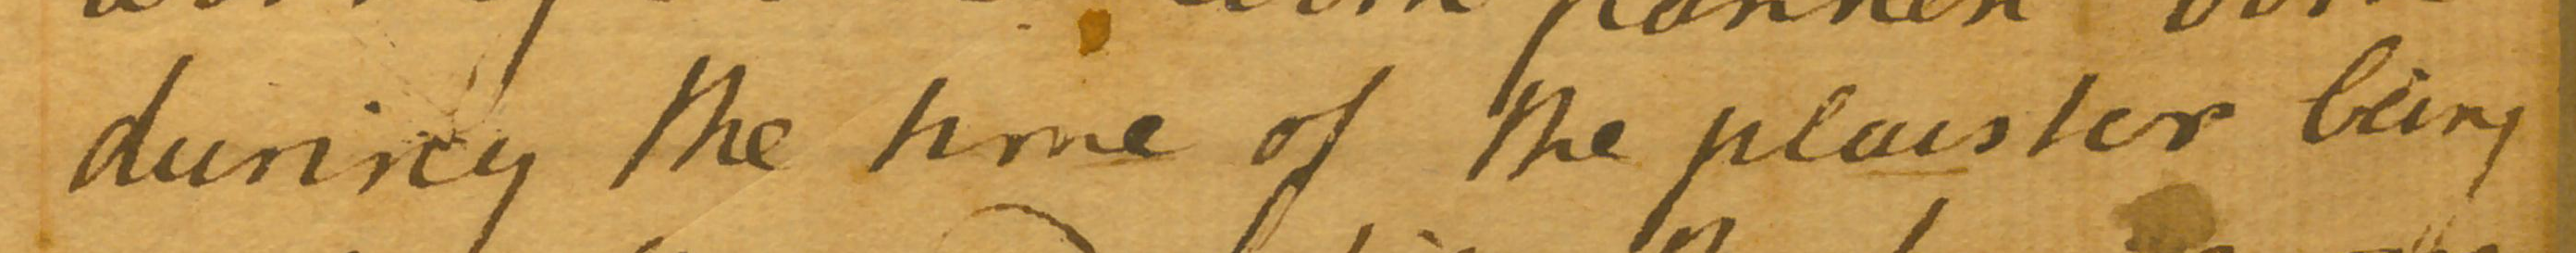during the time of the plaister being
